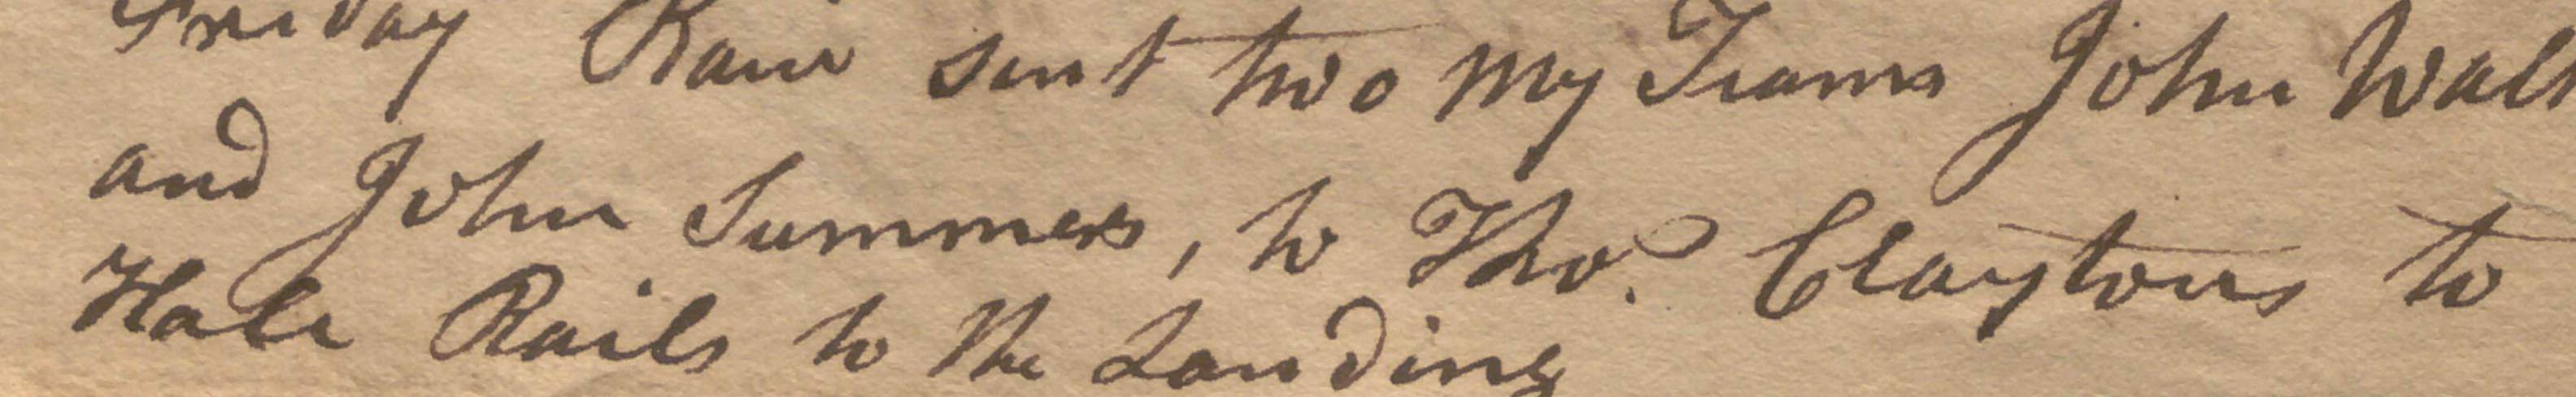and John Summers, to Tho^s. Claytons to
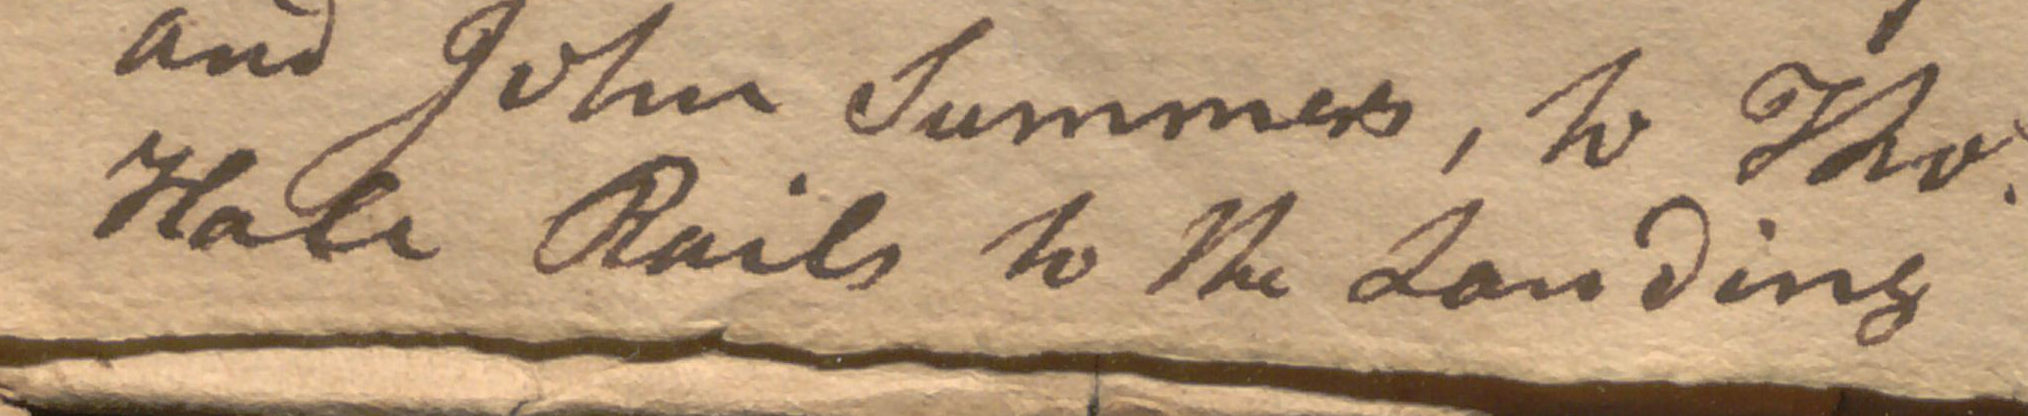Hale Rails to the Landing
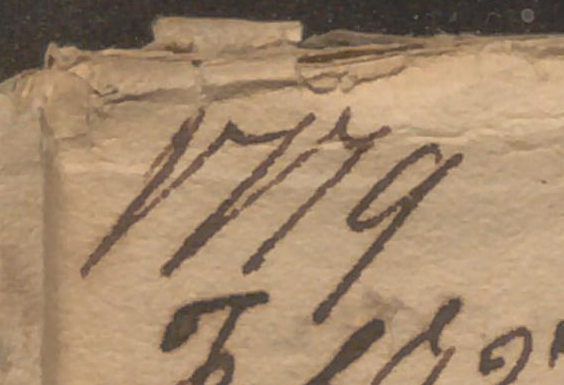1779
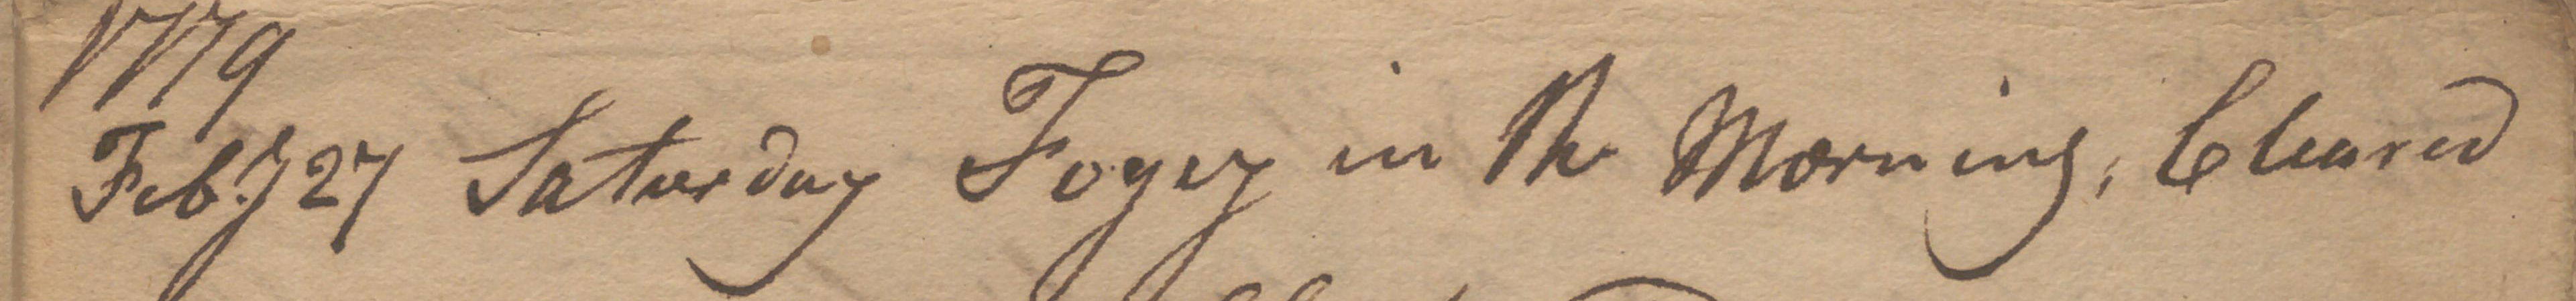Feb^y. 27 Saturday Fogey inthe Morning, Cleared
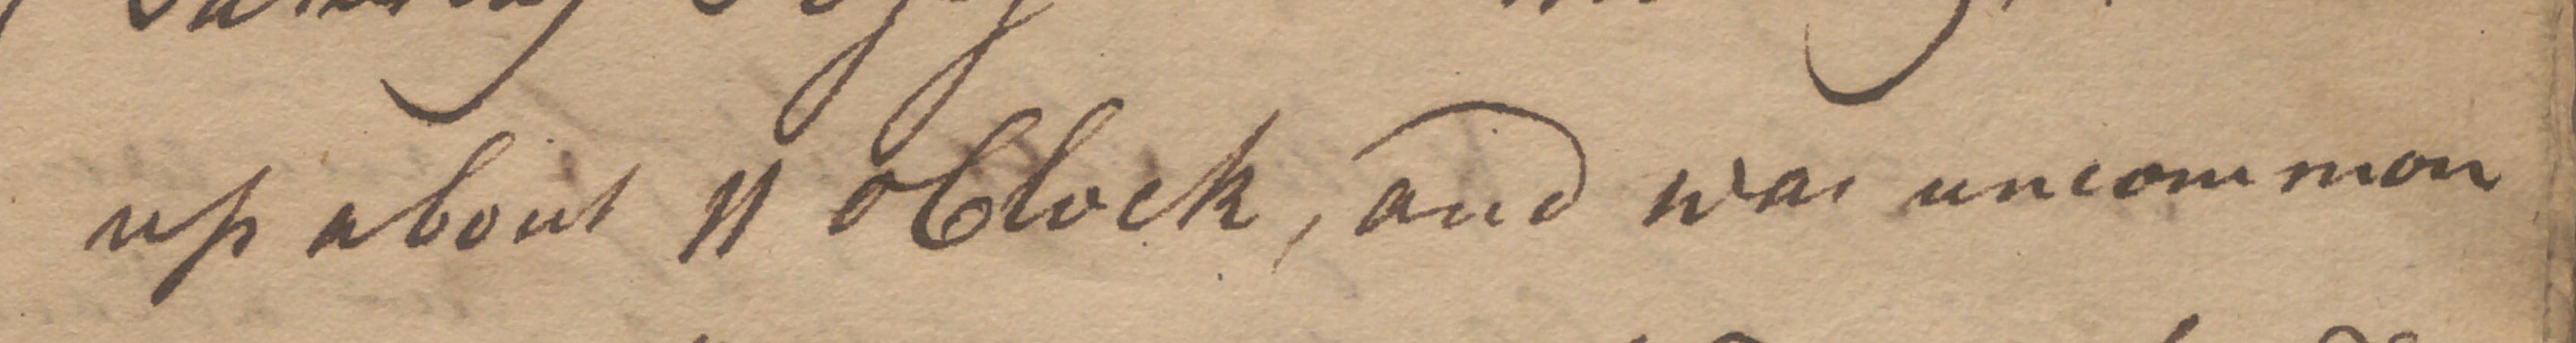up about 11 oClock, and was uncommon
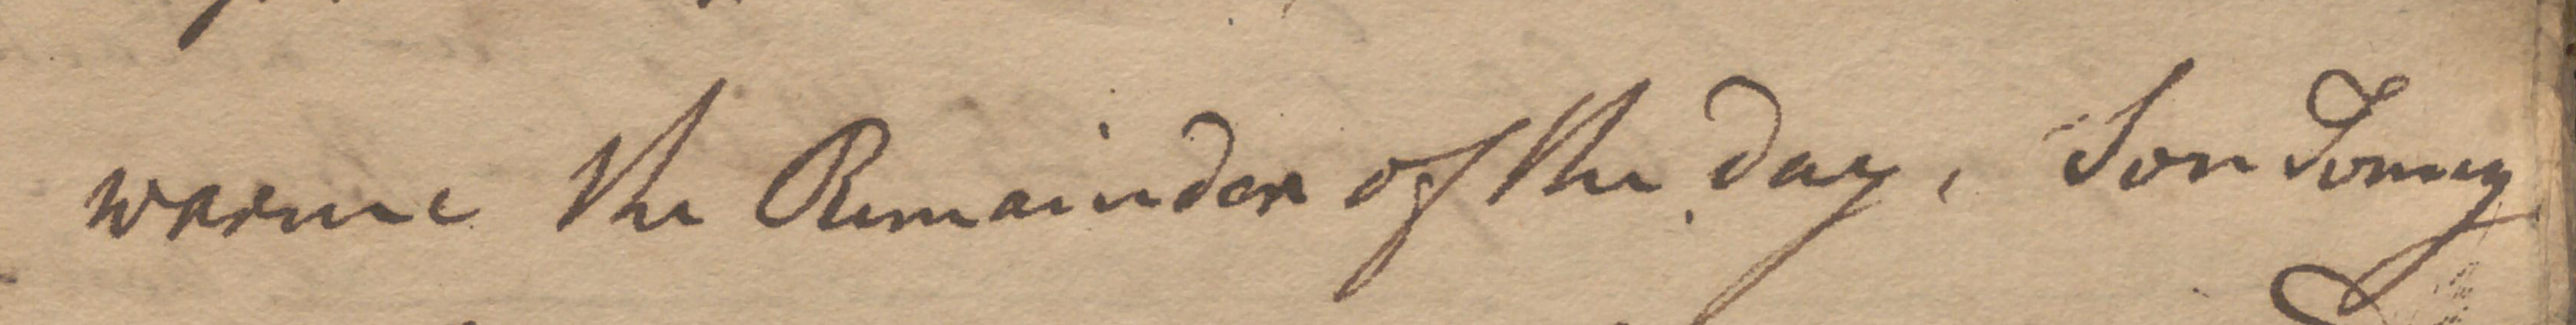warme the Remainder of the day. Son Tomey
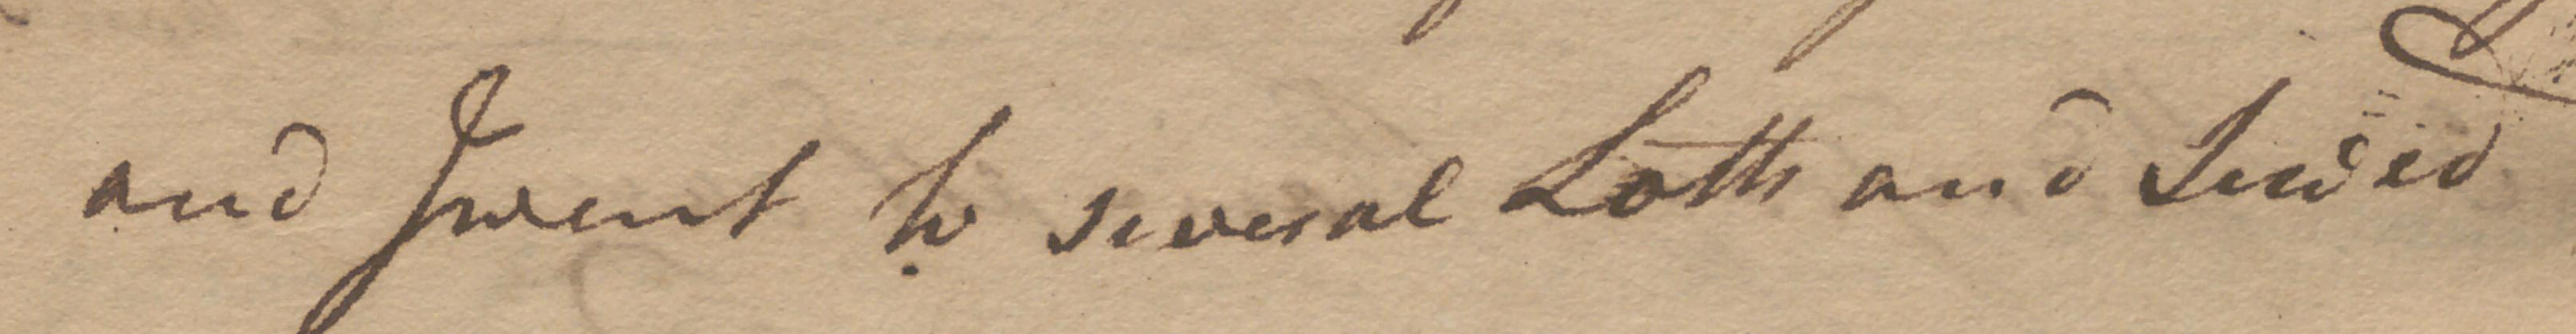and I went to several Lotts and sewed
